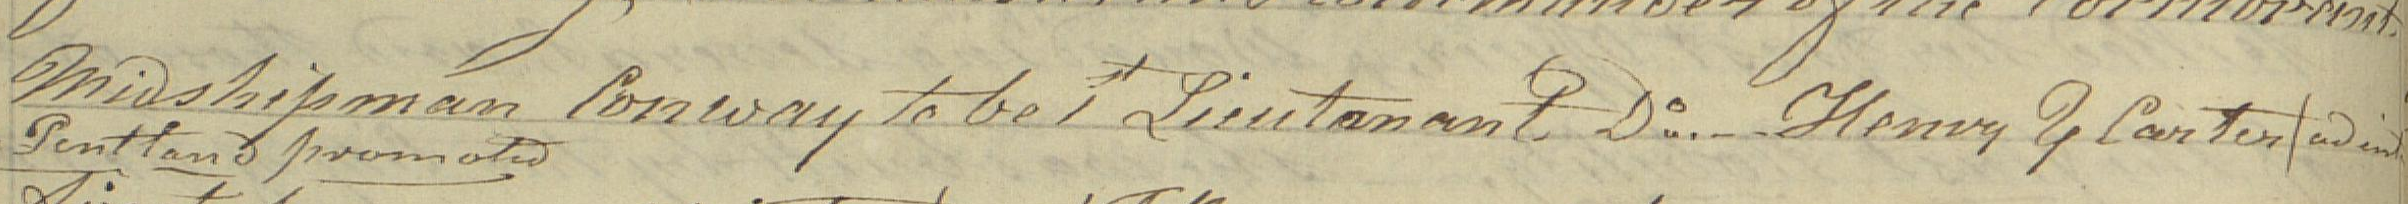Midshipman Conway to be 1^st Lieutenant D^o.- Henry Y Carter / ad-
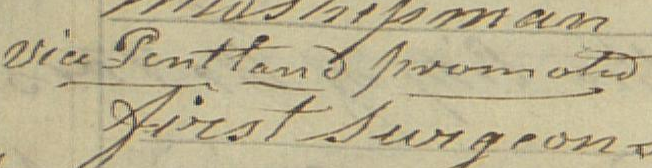vice Pentland promoted
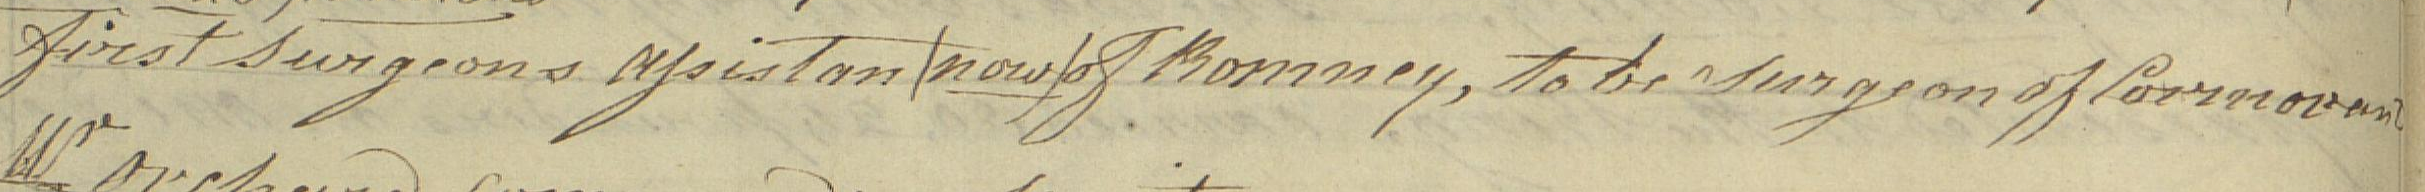First Surgeons assistant (now) of Romney, to be Surgeon of Cormovant
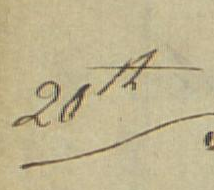20^th
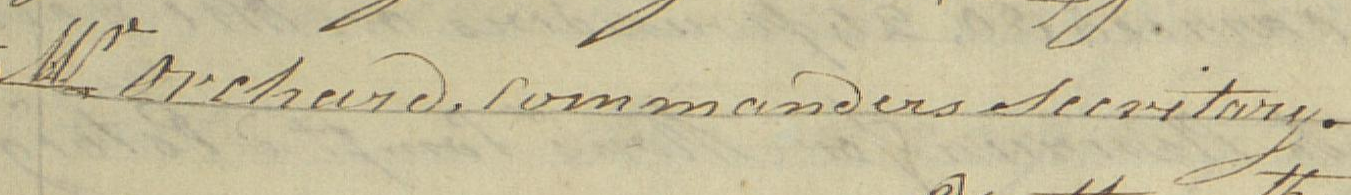M^r. M^cChard Commanders secritary.
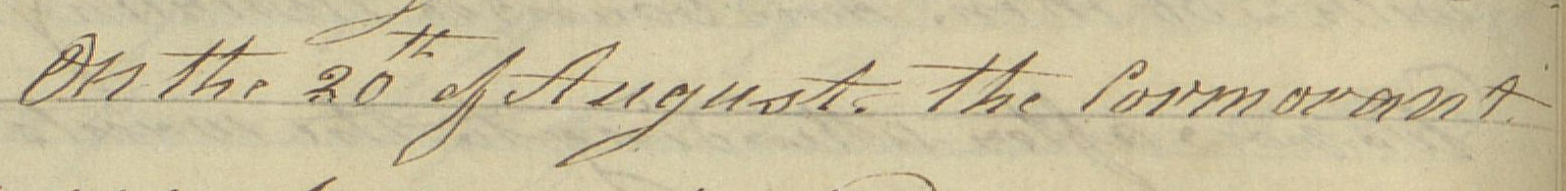On the 30^th of August. the Cormorant
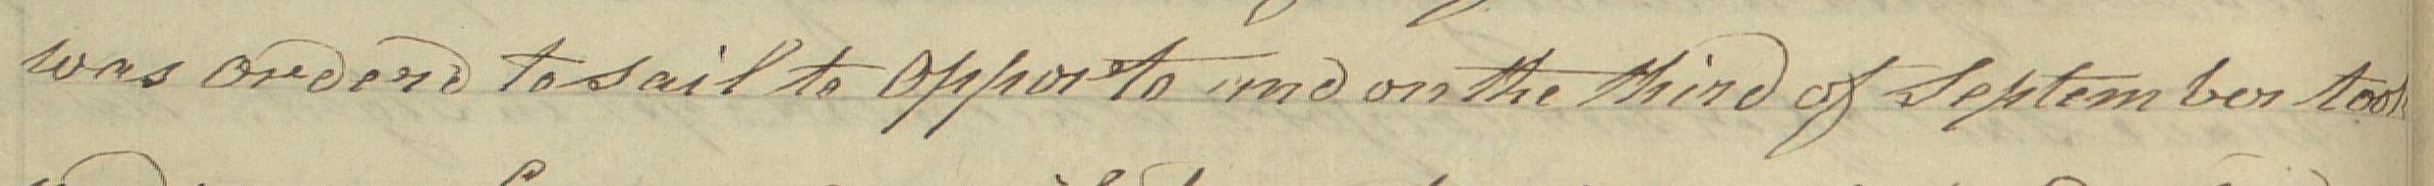was orderd to sail to Opporto and on the third of September took
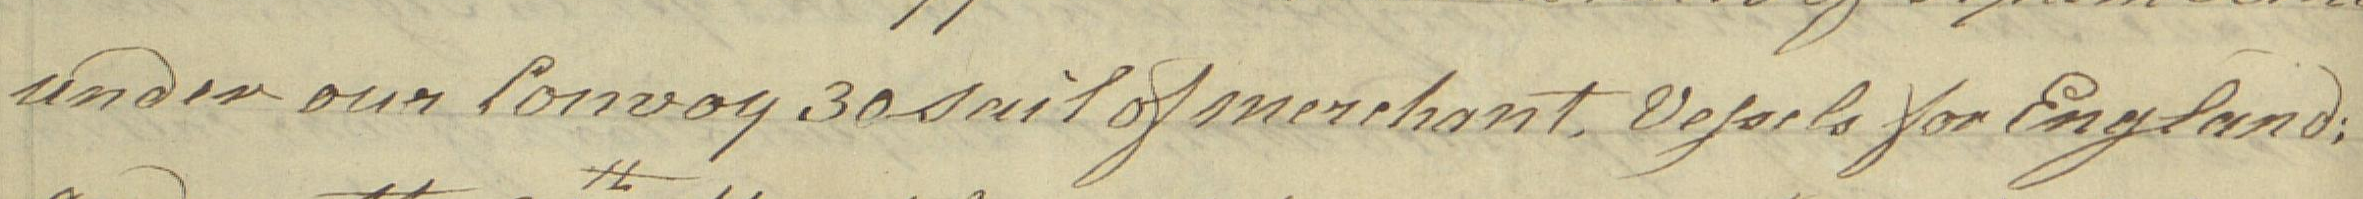under our Convoy 30 sail of merchant Vessels for England:
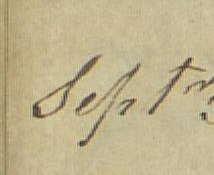Sept^r 3
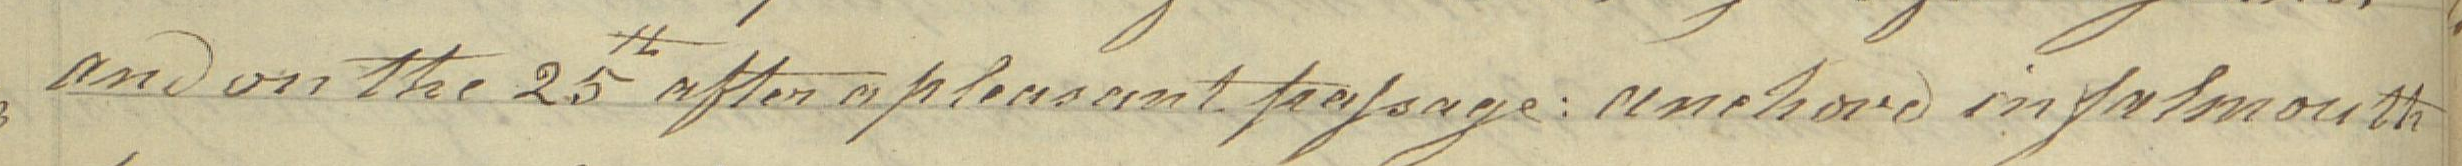and on the 25^th after a pleasant passage: anchord in falsmouth
